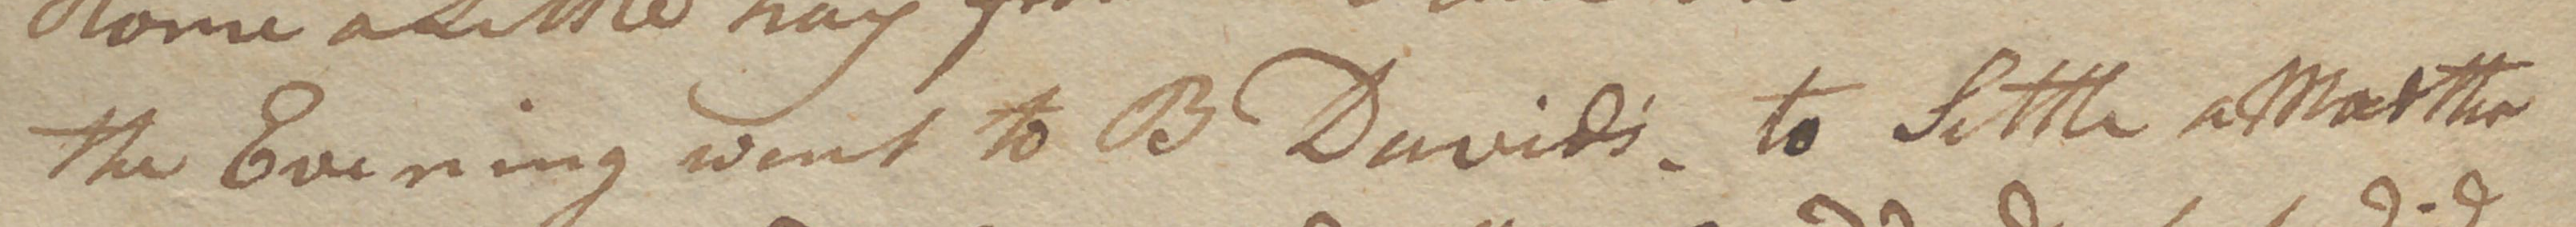the Evening went to B Davids, to Settle a Matthr
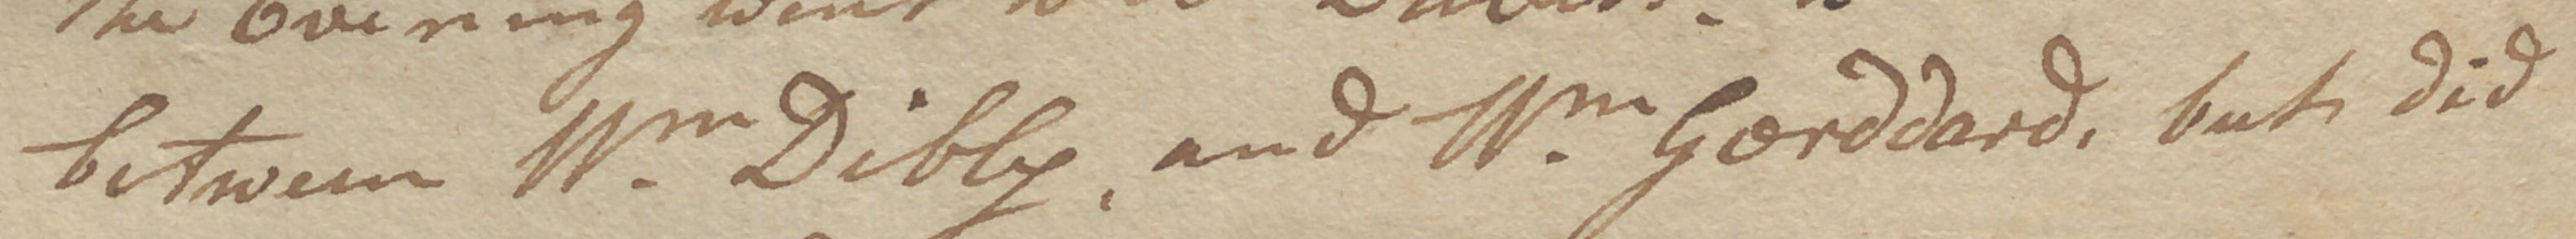between W^m. Dibly, and W^m. Gorddard. but did
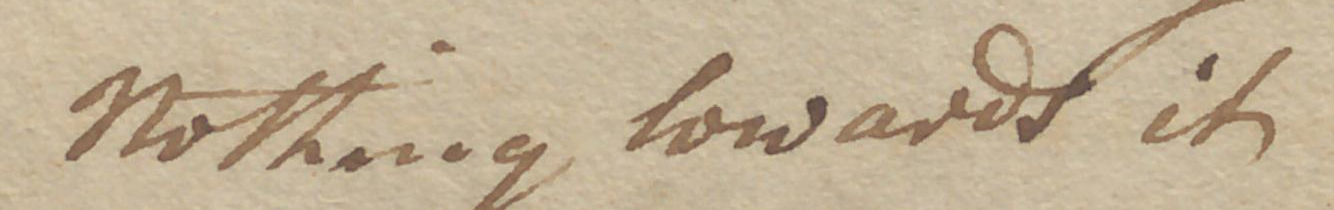Nothing towards it
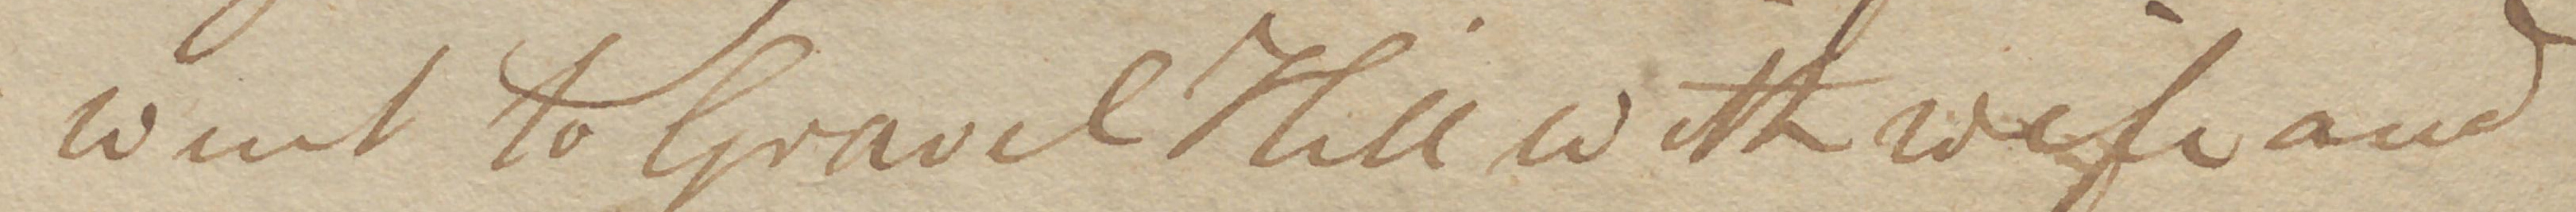went to Gravel Hill with wife and
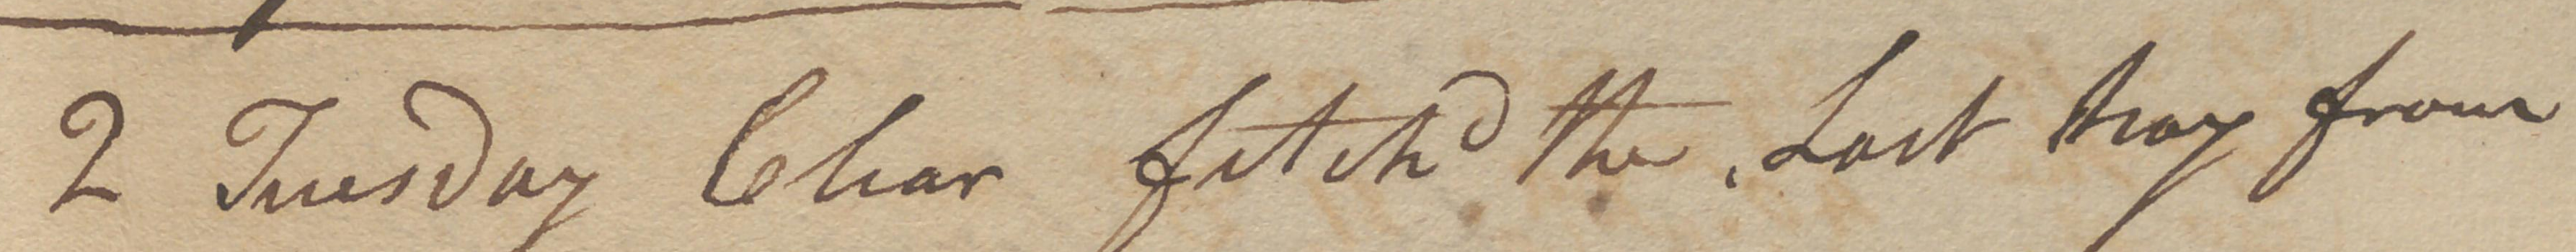2 Tuesday Clear fetch^d the, Last hay from
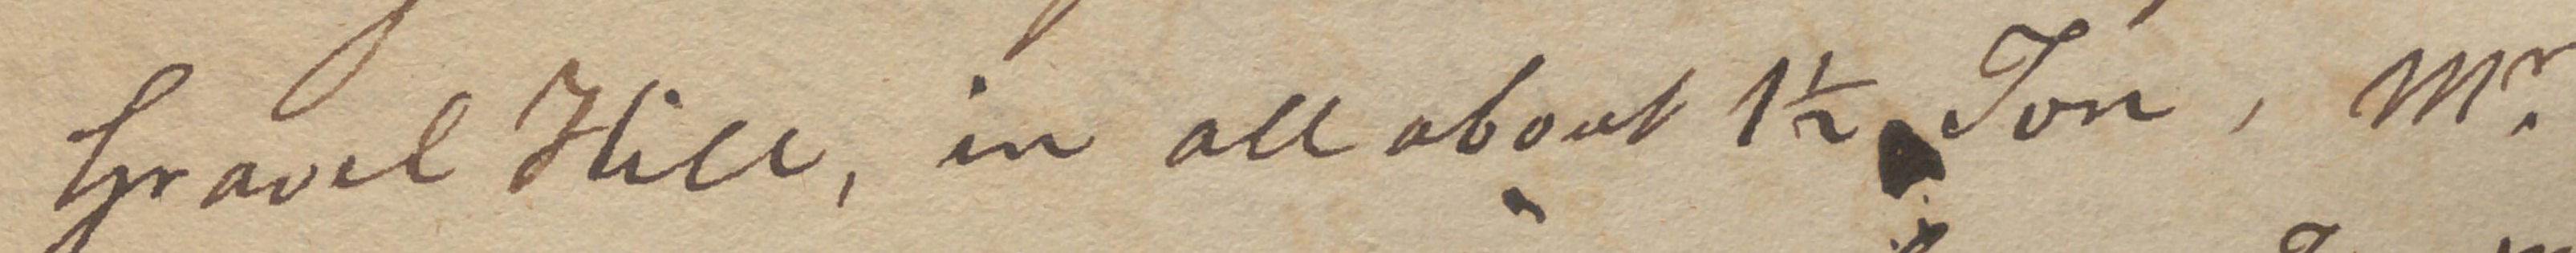Gravel Hill, in all about 1 1/2 Ton, M^r.
